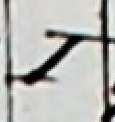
I
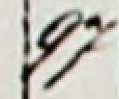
97
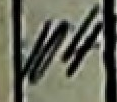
104
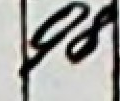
98
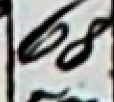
68
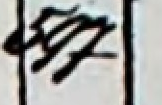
597
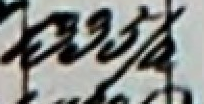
1335/a
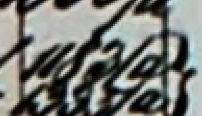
1183/a
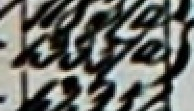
1335/a
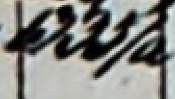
1335/a
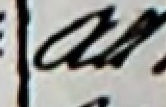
Alt
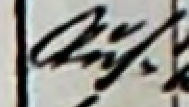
Aus„
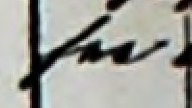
see
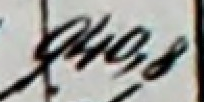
940,8
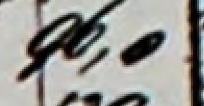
96,0
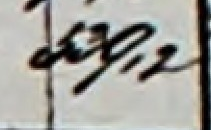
539,2
